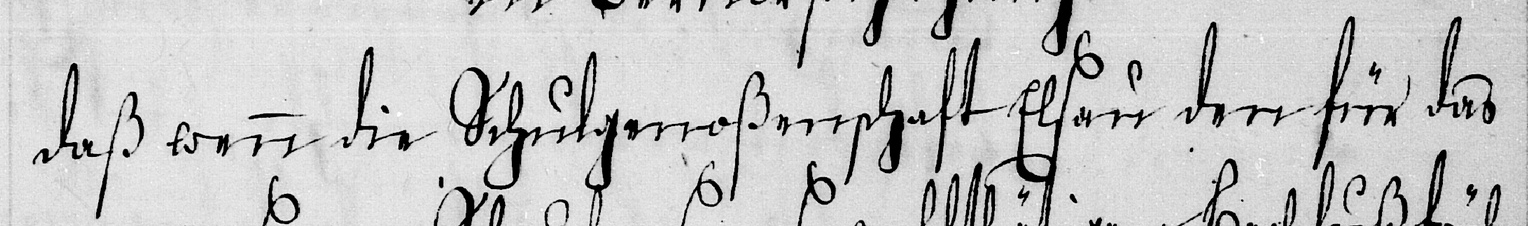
daß wenn die Schulgenoßenschaft Elsau den für das
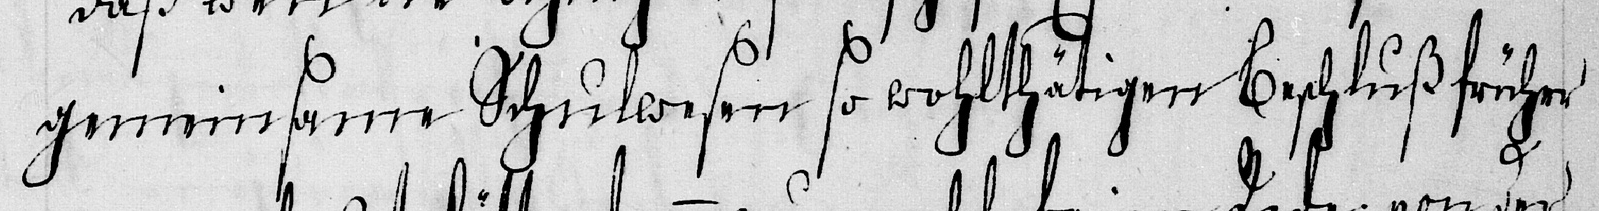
gemeinsame Schulwesen so wohlthätigen Beschluß früher
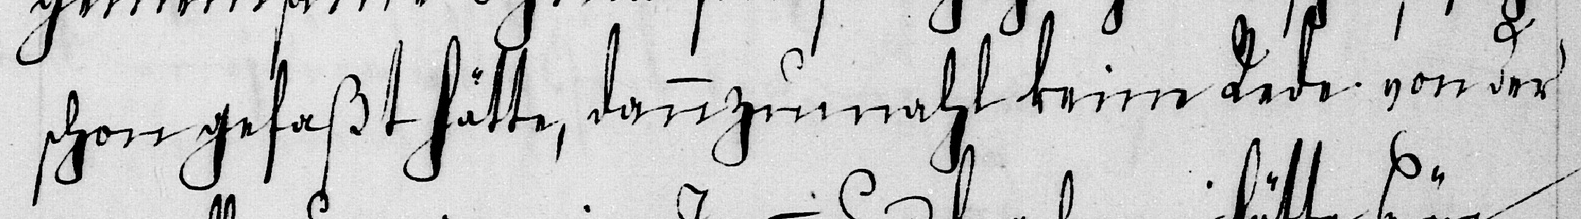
schon gefaßt hätte, dannzumahl keine Rede von der
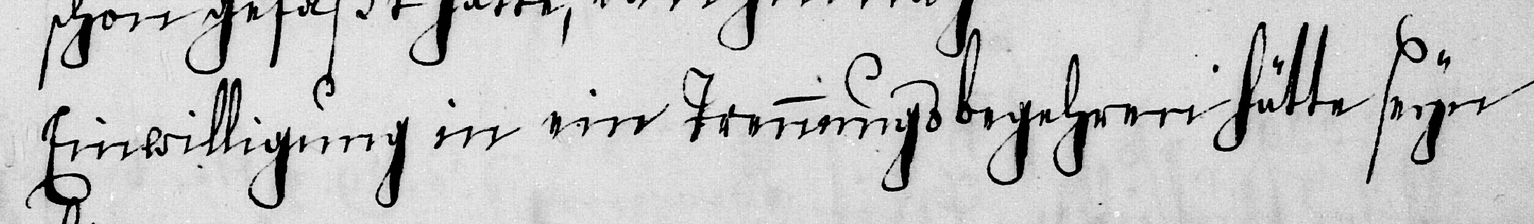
Einwilligung in ein Trennungsbegehren hätte seyn
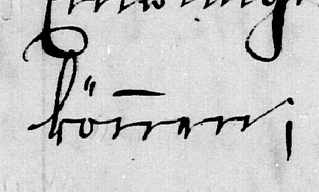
können;
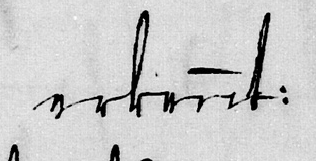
erkennt:
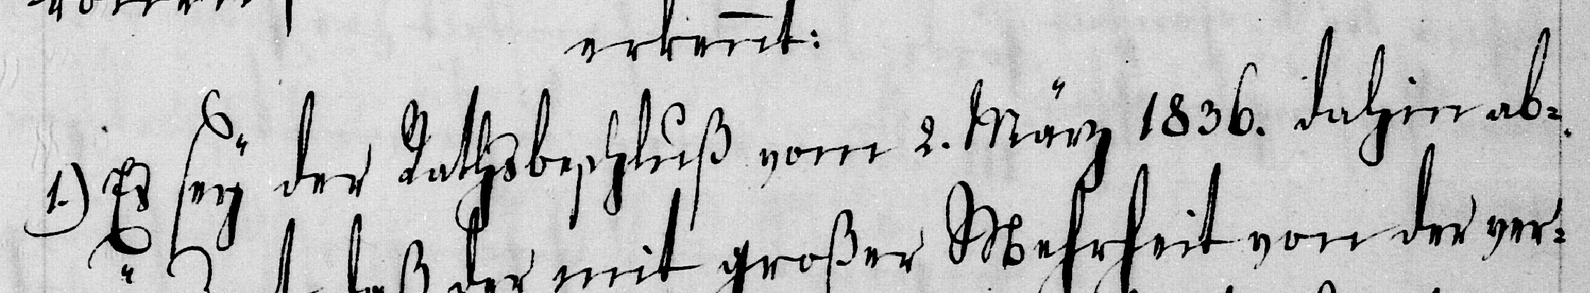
1.) Es sey der Rathsbeschluß vom 2. März 1836. dahin ab¬
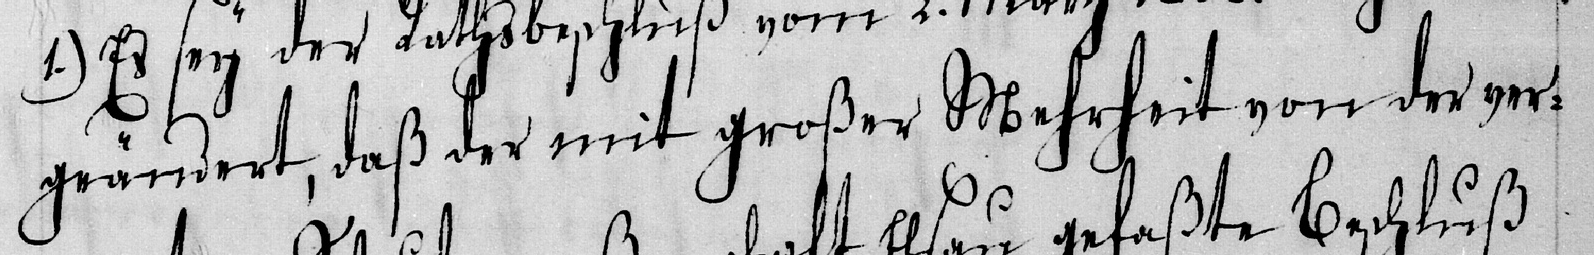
geändert, daß der mit großer Mehrheit von der ver¬
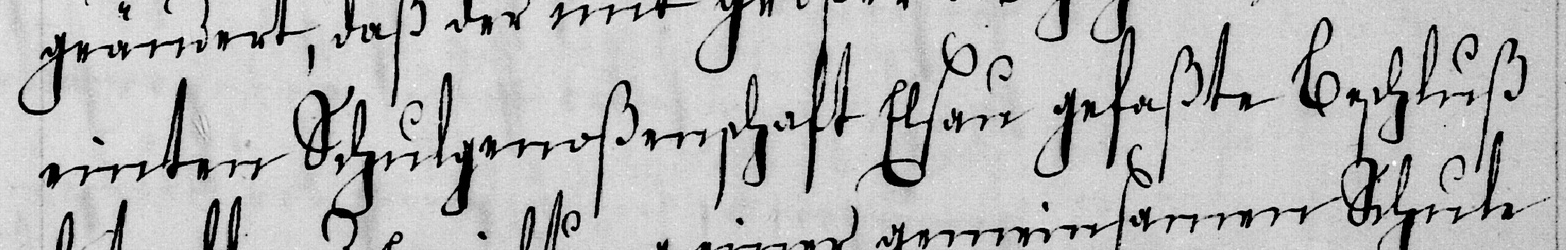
einten Schulgenoßenschaft Elsau gefaßte Beschluß
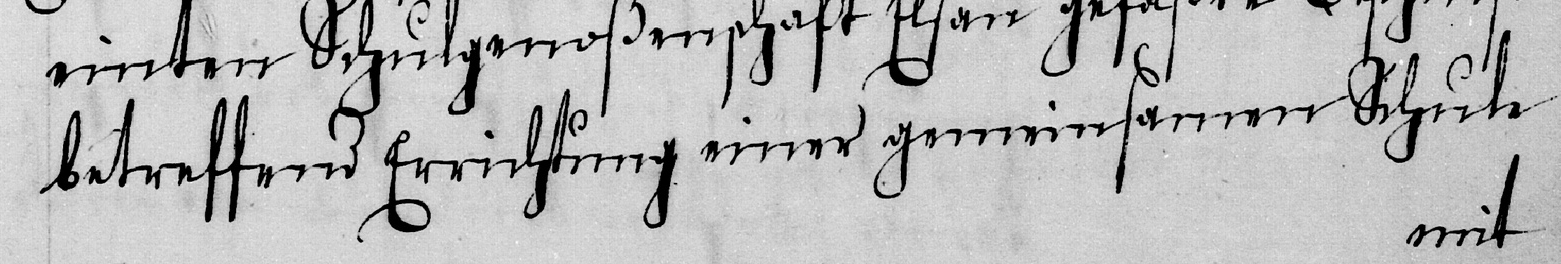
betreffend Errichtung einer gemeinsamen Schule
